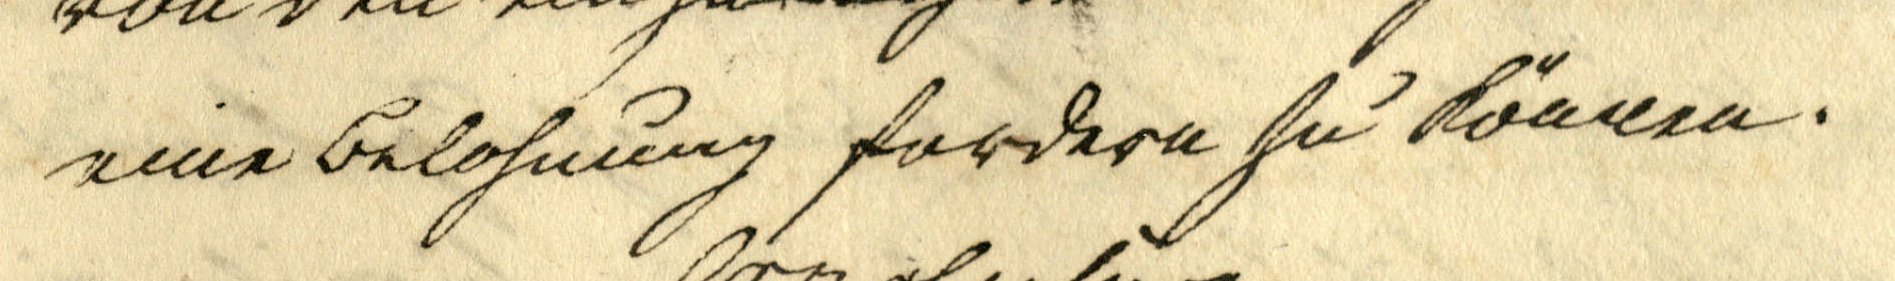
eine Belohnung fordern zu können.
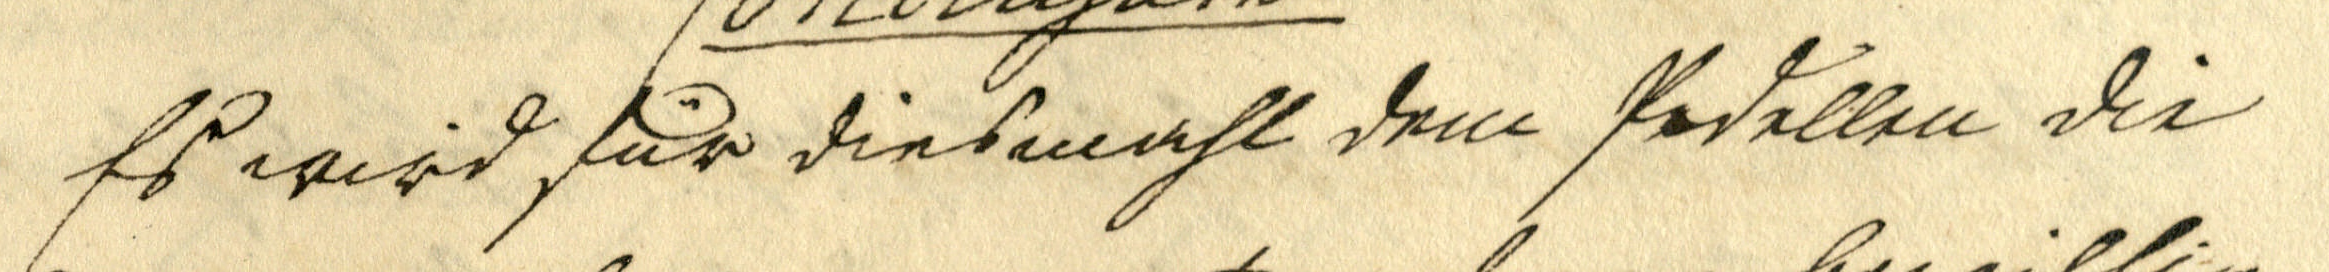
Es wird für diesmahl dem Pedellen die
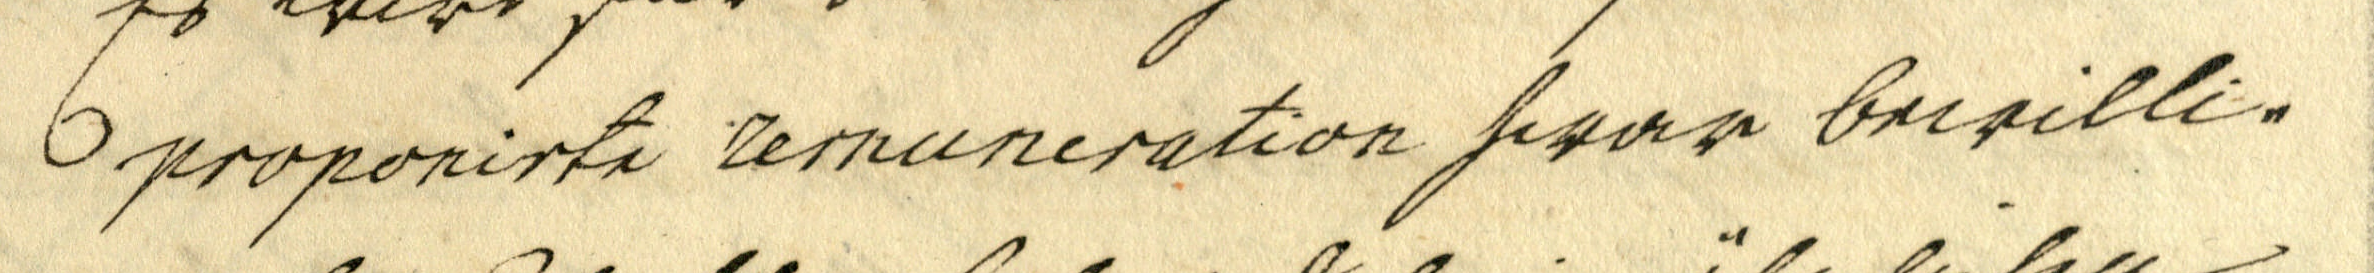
proponirte remuneration zwar bewilli¬
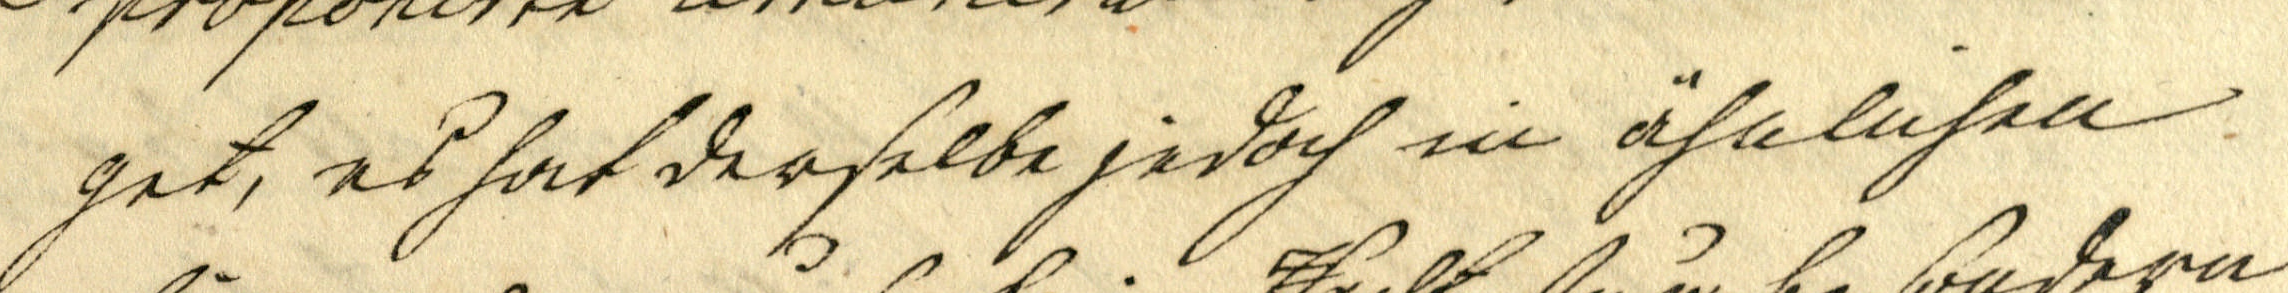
get, es hat derselbe jedoch in ähnlichen
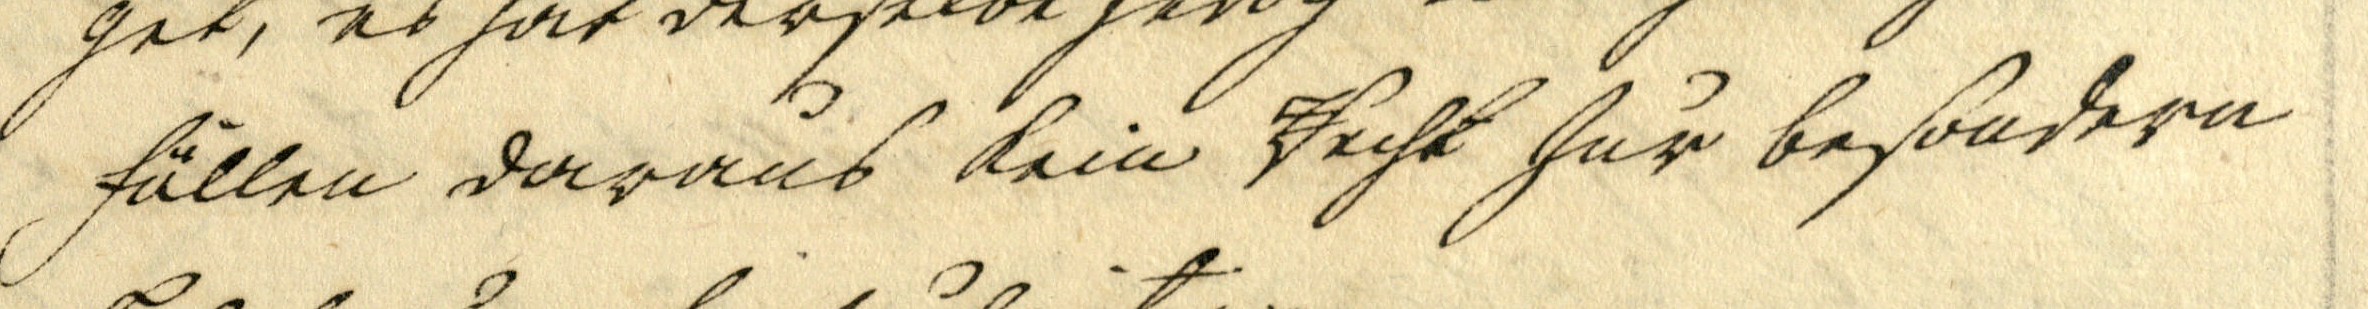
Fällen daraus kein Recht zur besondern
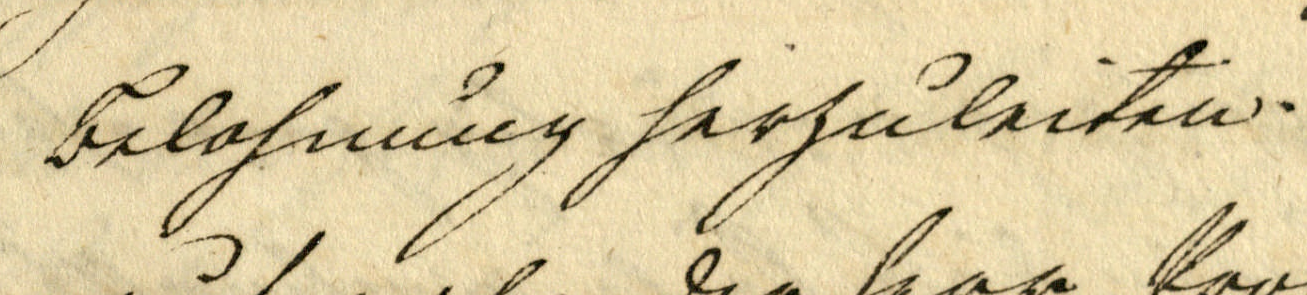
Belohnung herzuleiten.
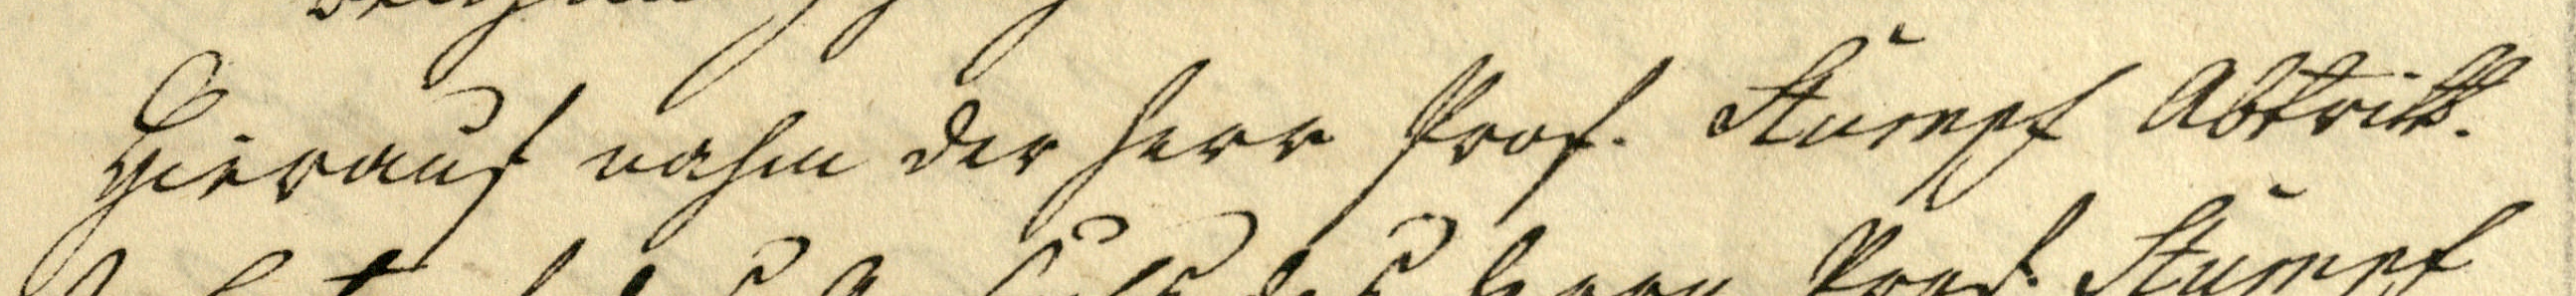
Hierauf nahm der Herr Prof. Stumpf Abtritt.
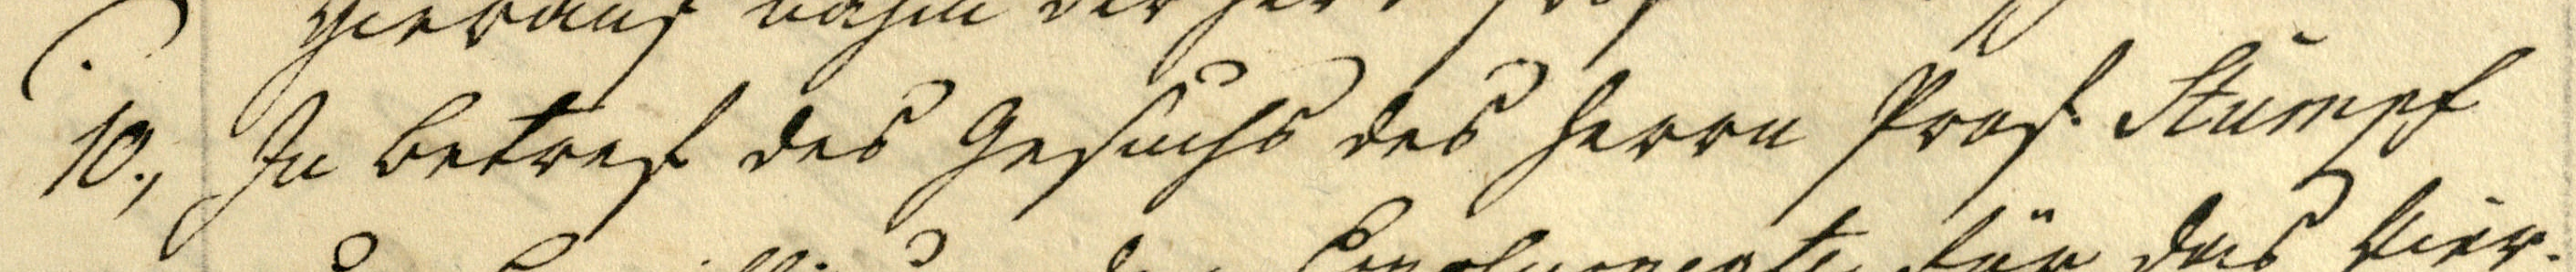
10., In Betref des Gesuchs des Herrn Prof. Stumpf
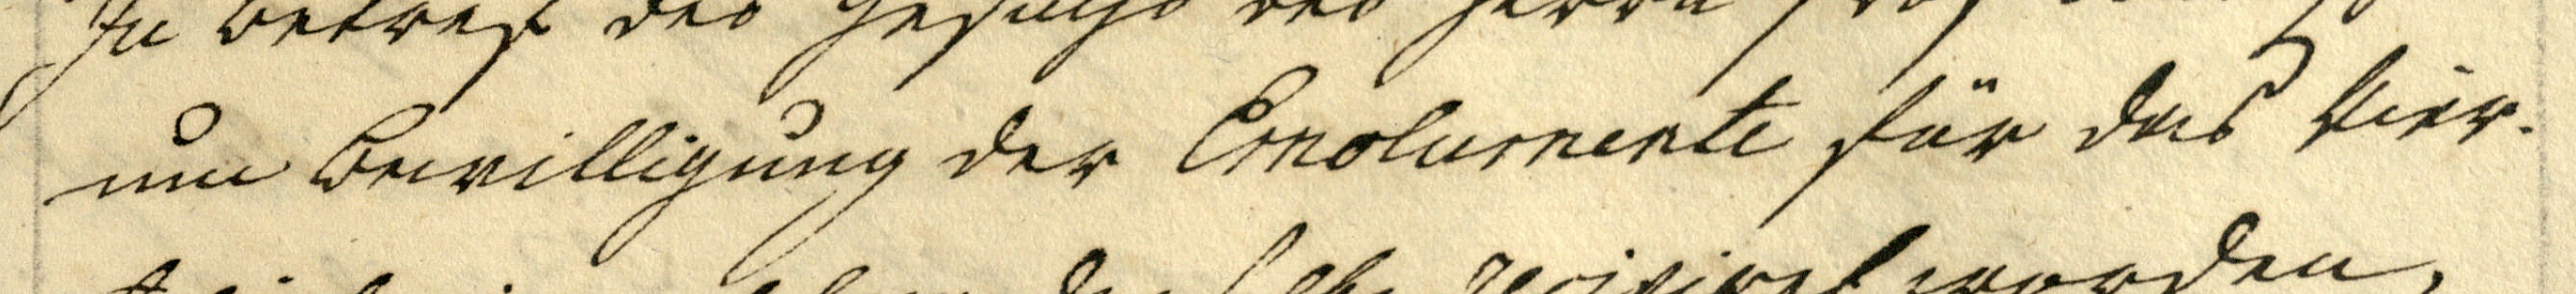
um Bewilligung der Emolumente für das Vier¬
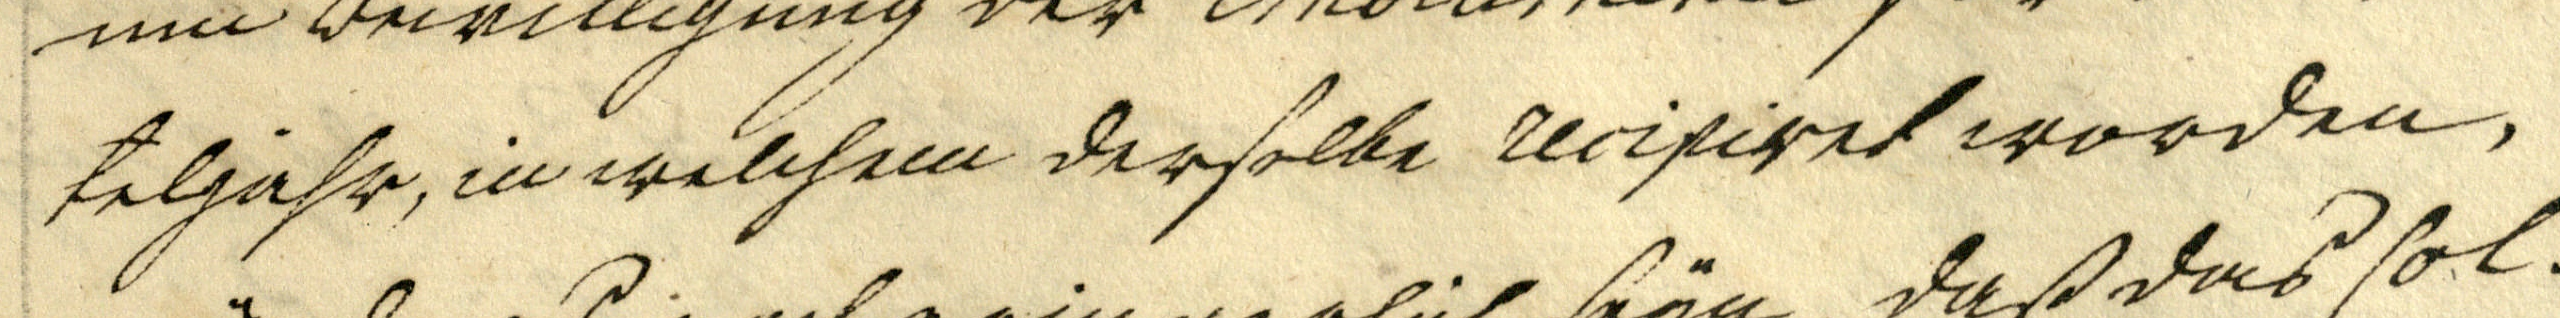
teljahr, in welchem derselbe recipiret worden,
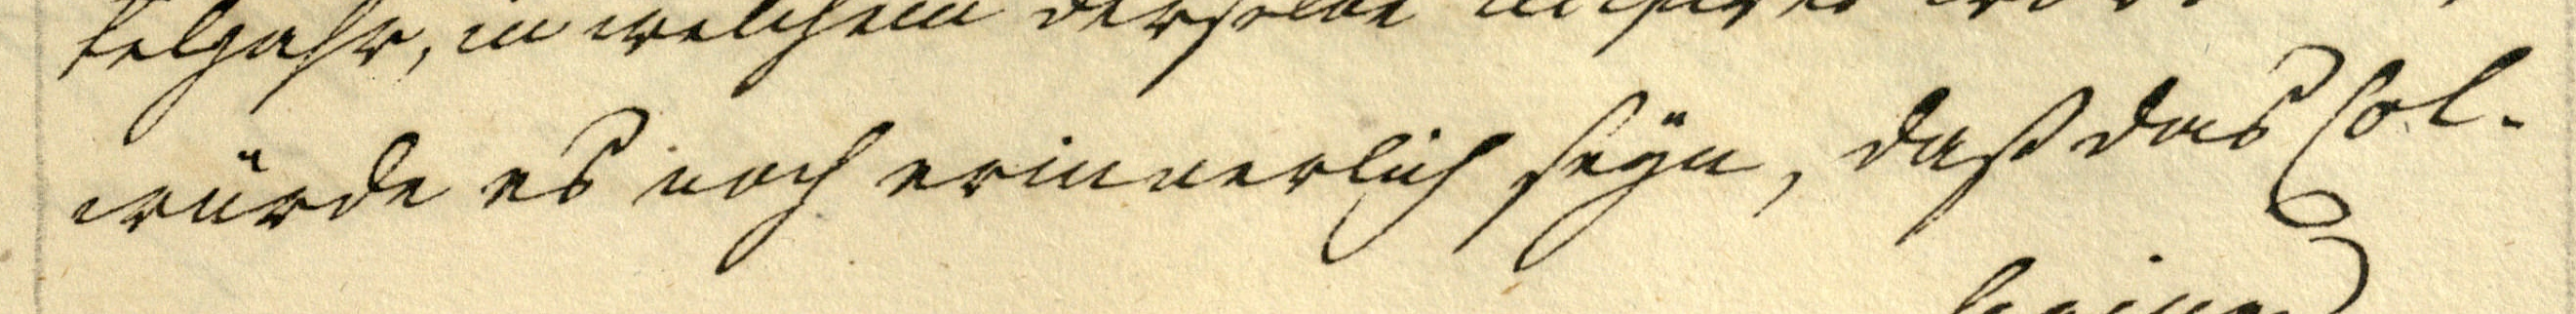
würde es noch erinnerlich seÿn, daß das Col¬
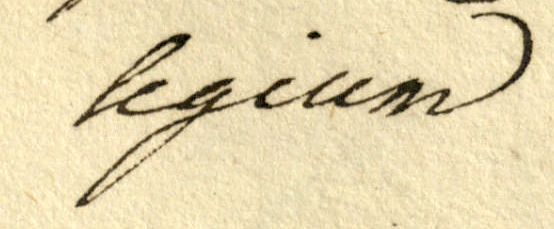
legium
